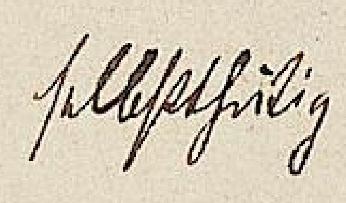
selbstthätig
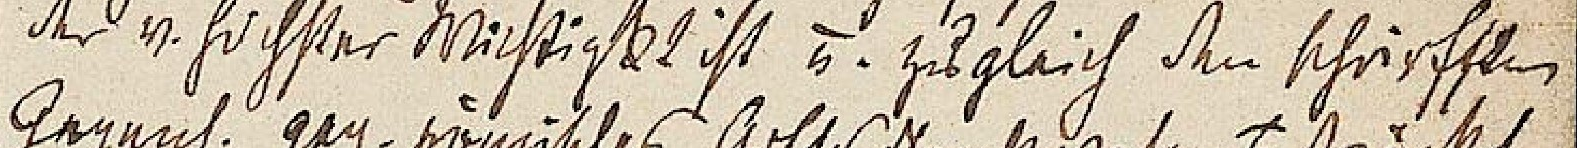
der v. höchster Wichtigkt ist u. ugleich den schärfsten
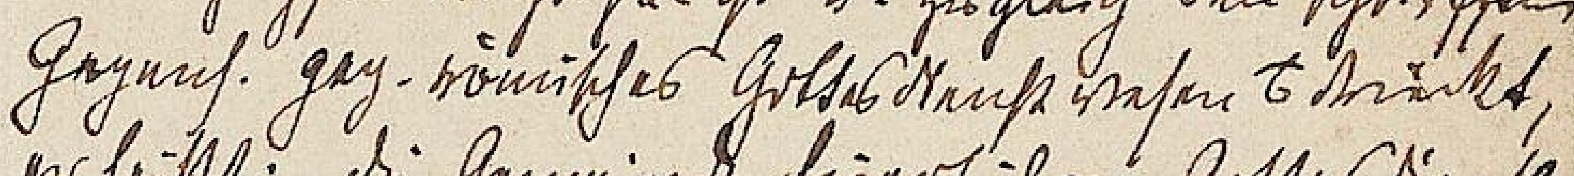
Gegens. geg. römisches Gottesdienstwesen s drückt,
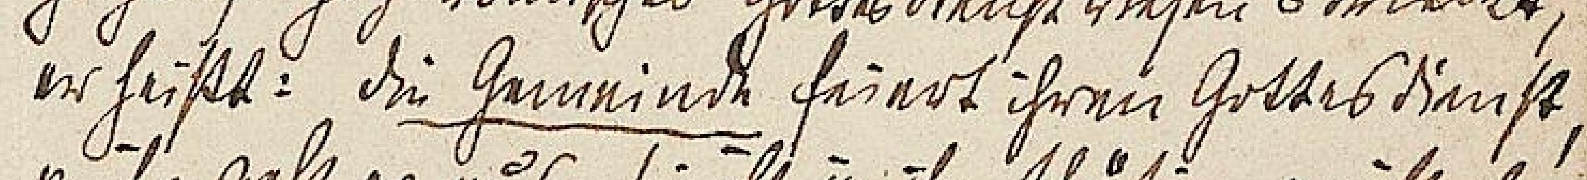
er heißt: die Gemeinde feiert ihren Gottesdienst,
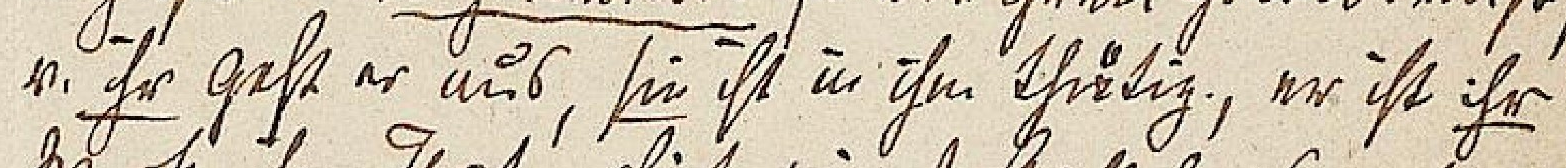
v. ihr geht er aus, sie ist in ihm thätig, er ist ihr
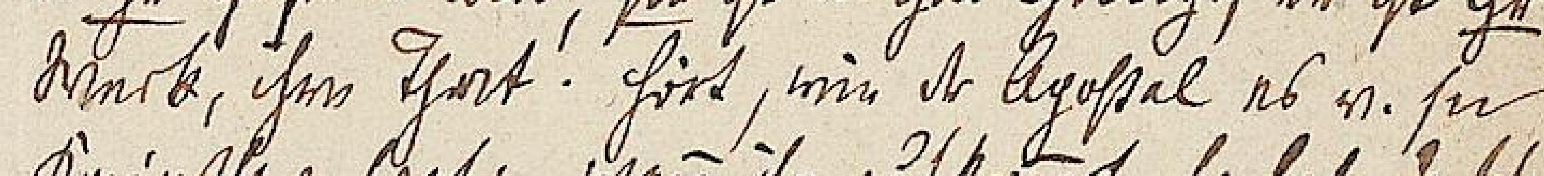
Werk, ihre That. Hört, wie der Apostel es v. sn
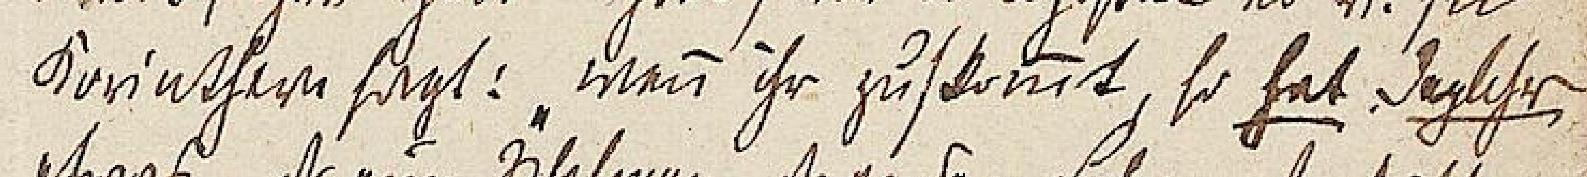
Korinthern sagt: "wen ihr zuskomt, so hat Jeglicher
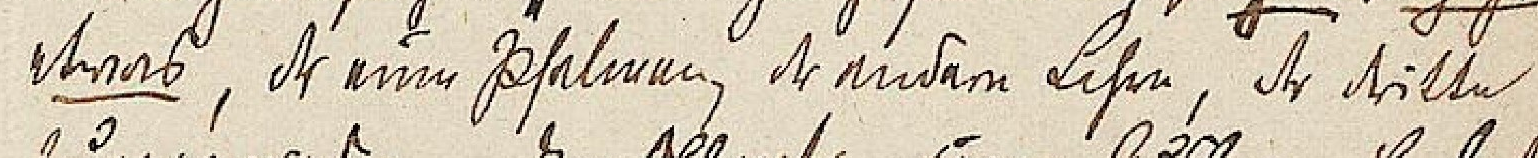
etwas, der eine Psalmen, der anderen Lehre, der dritten
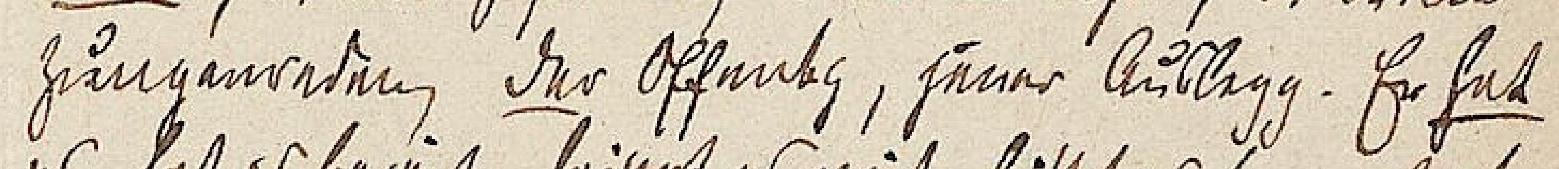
Zungenrede, der Offenbg, jener Auslegg. Er hat
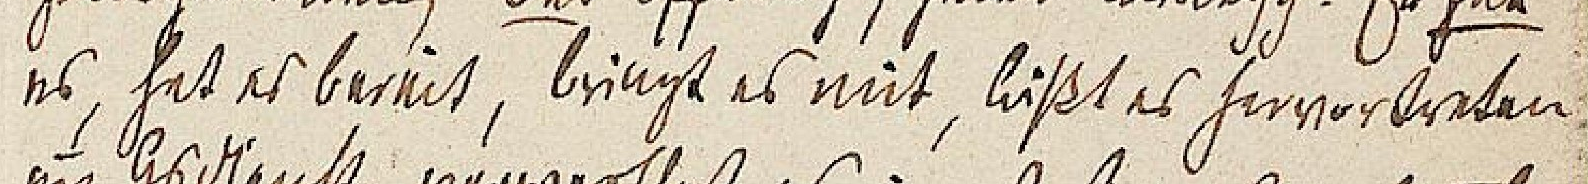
es, hat es bereit, bringt es mit, läßt es hervortreten
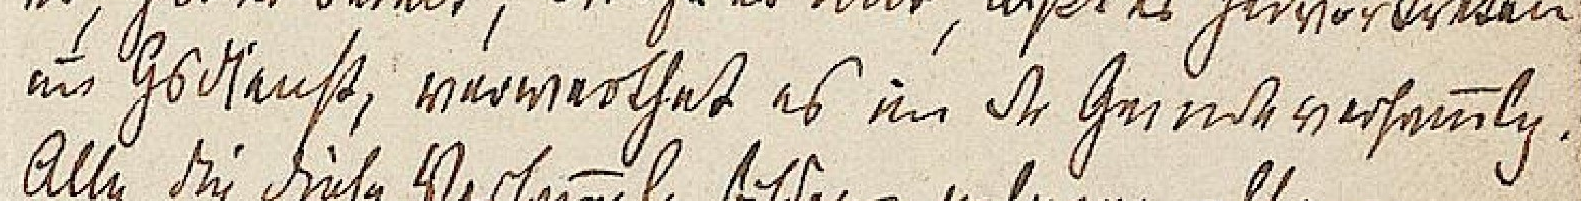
im Gsdienst, verwerthet es in der Gmndeversamlg.
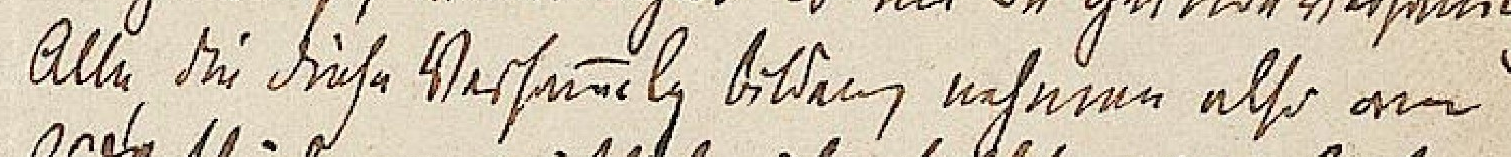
Alle die diese Versamlg bilden, nehmen also am
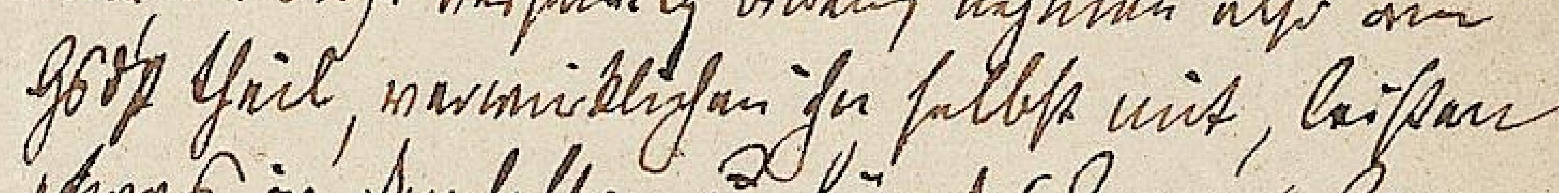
Gsdst theil, verwirklichen ihn selbst mit, leisten
